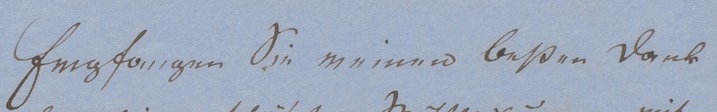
Empfangen Sie meinen besten Dank
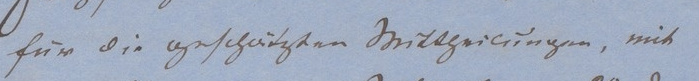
für die geschätzten Mittheilungen, mit
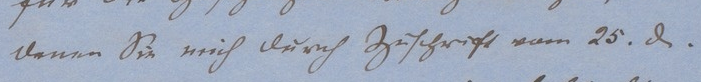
denen Sie mich durch Zuschrift vom 25. d.
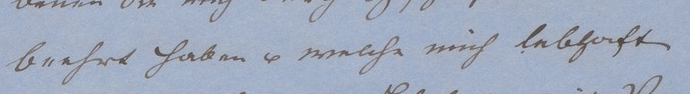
beehrt haben & welche mich lebhaft
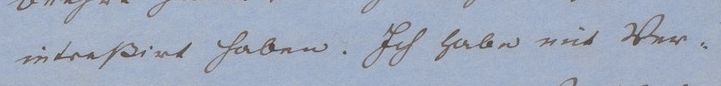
intreßirt haben Ich habe mit Ver-
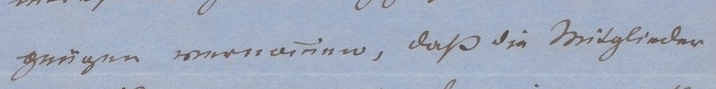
gnügen vernommen, daß die Mitglieder
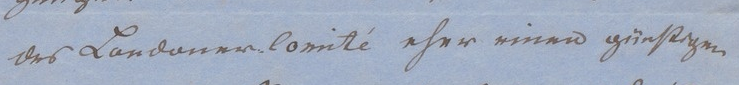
des Londoner-Comité eher einen günstigen
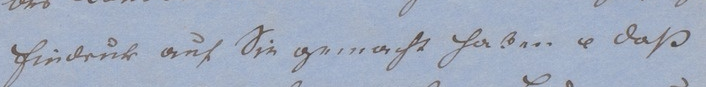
Eindruk auf Sie gemacht haben & daß
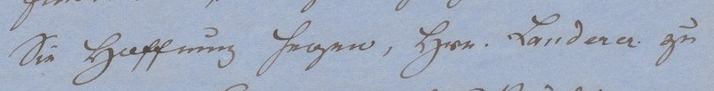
Sie Hoffnung hegen, Hrn. Landerer zu
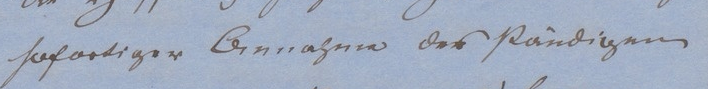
sofortiger Annahme des ständigen
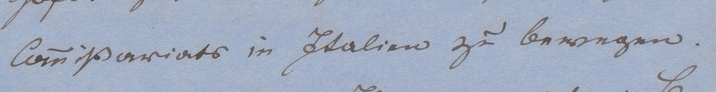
Commißariats in Italien zu bewegen.
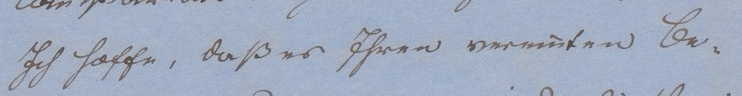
Ich hoffe, daß es Ihren vereinten Be-
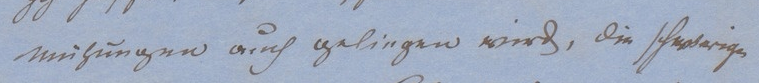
mühungen auch gelingen wird, die schwierige
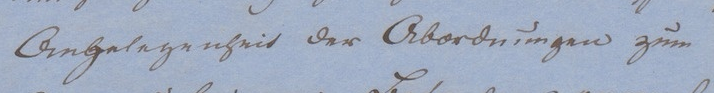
Angelegenheit der Abordnungen zum
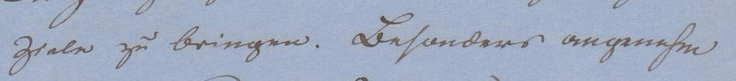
Ziele zu bringen. Besonders angenehm
